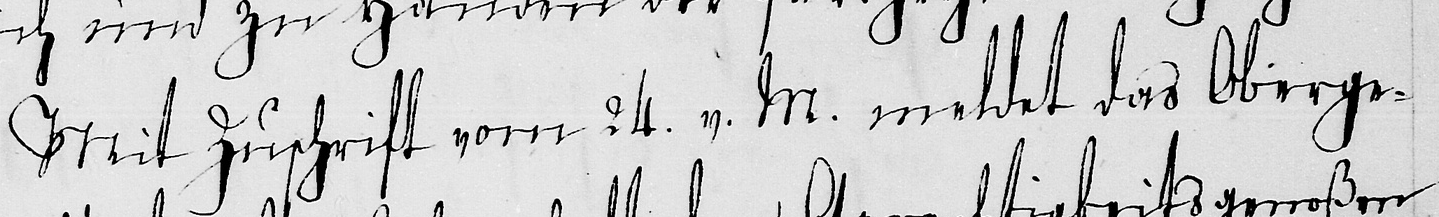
Mit Zuschrift vom 24. v. M. meldet das Oberge¬
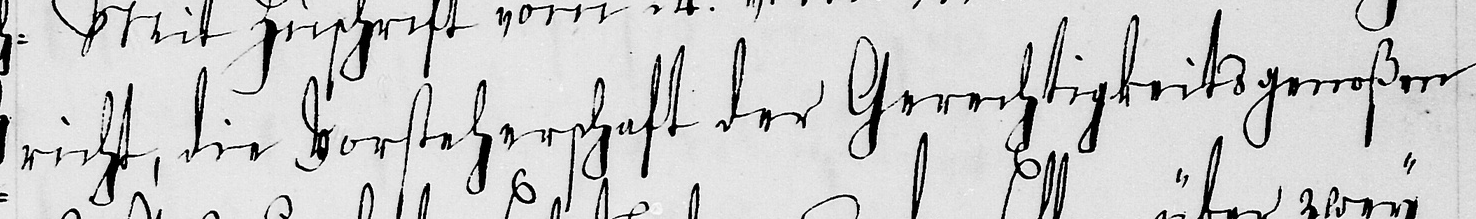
richt, die Vorsteherschaft der Gerechtigkeitsgenoßen
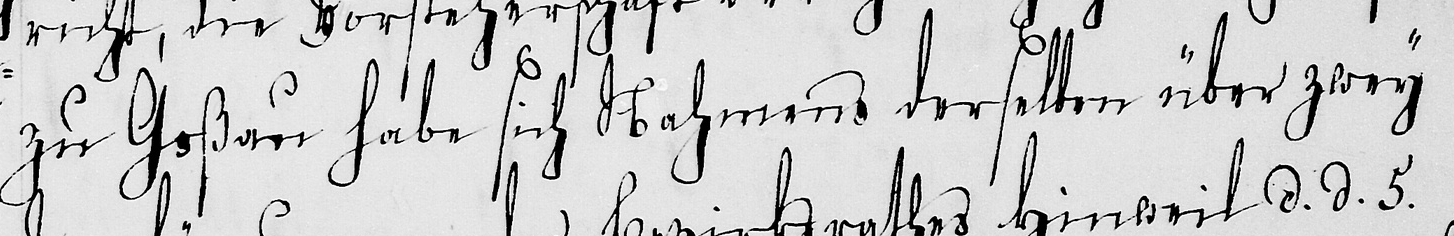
zu Goßau habe sich Nahmens derselben über zwey
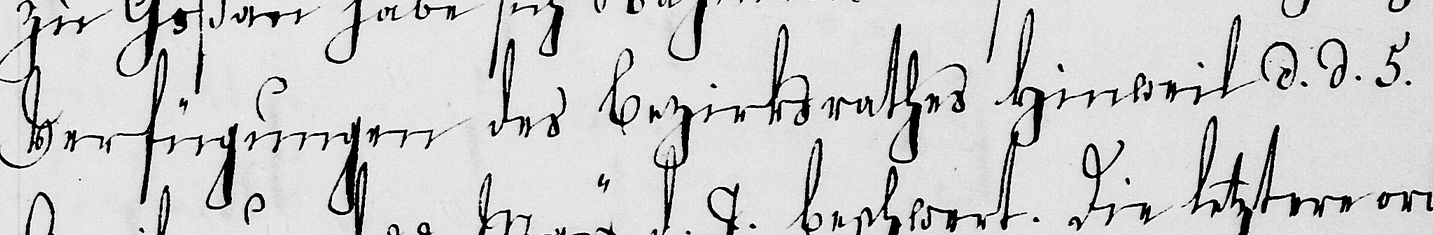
Verfügungen des Bezirksrathes Hinweil d. d. 5.
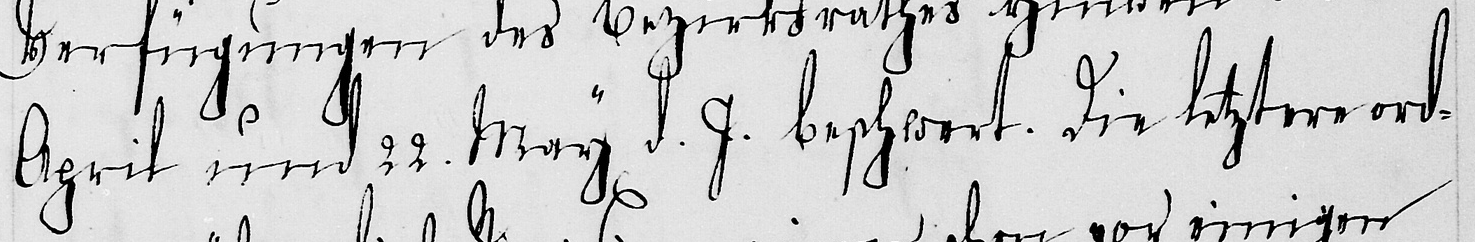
April und 22. May d. J. beschwert. Die letzere ord¬
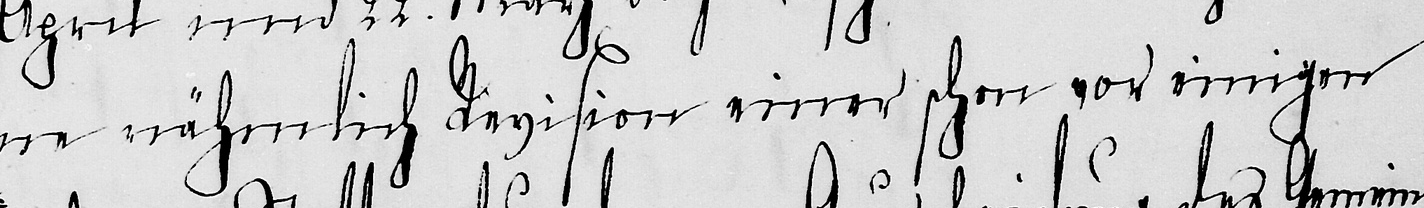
ne nähmlich Revision einer schon vor einigen
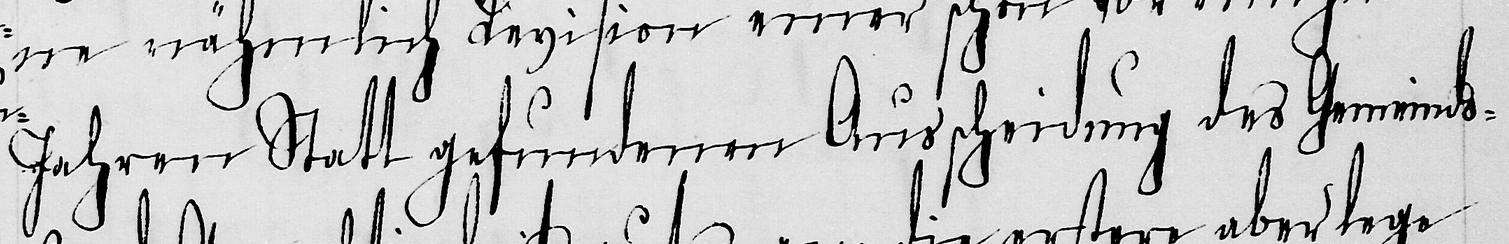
Jahren Statt gefundenen Ausscheidung des Gemeind¬
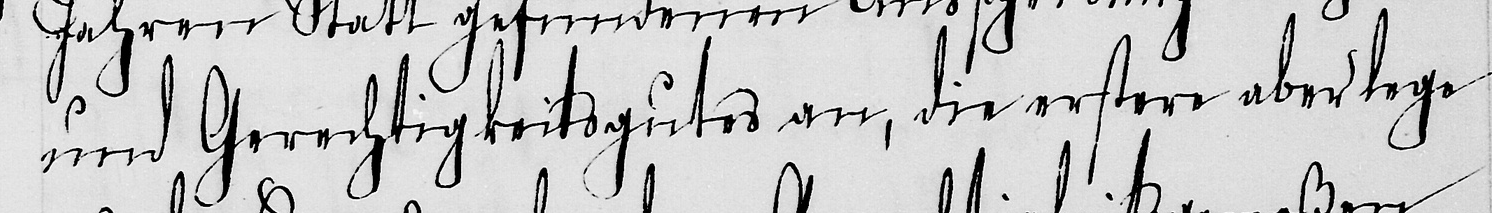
und Gerechtigkeitsgutes an, die erstere aber lege
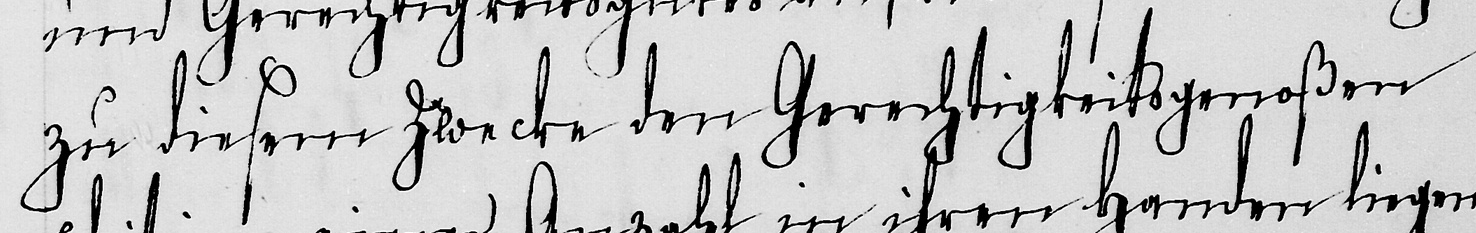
zu diesem Zwecke den Gerechtigkeitsgenoßen
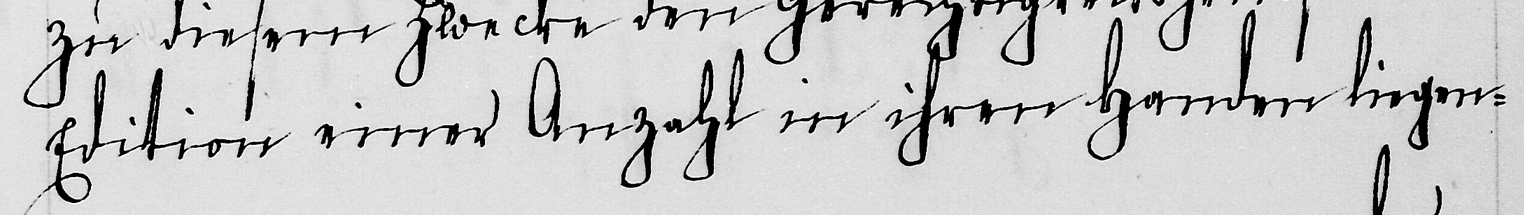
Edition einer Anzahl in ihren Handen liegen-
